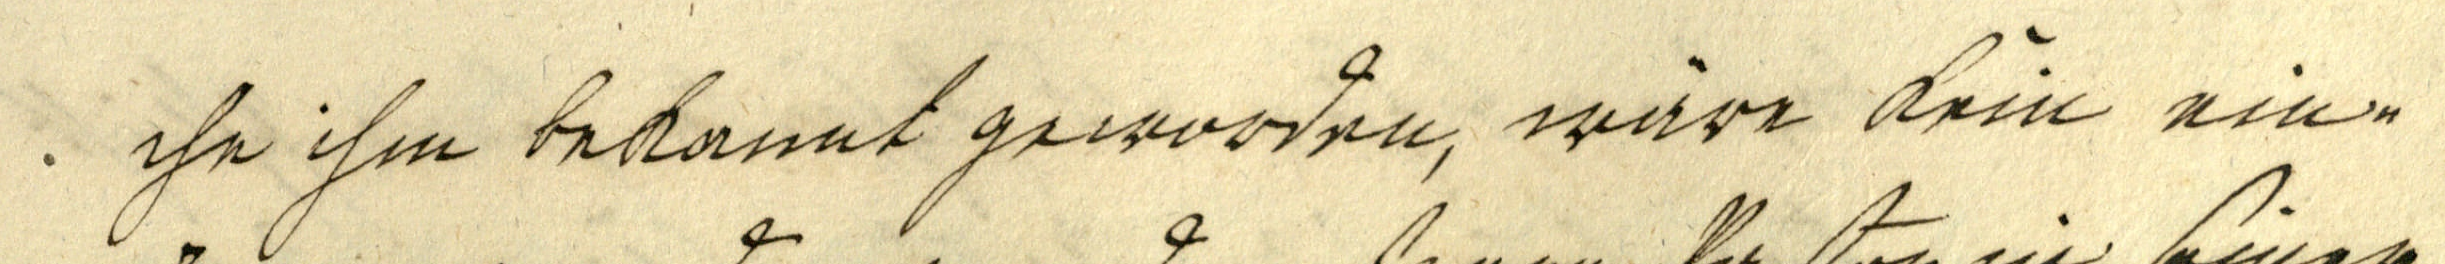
che ihm bekannt geworden, wäre kein ein-
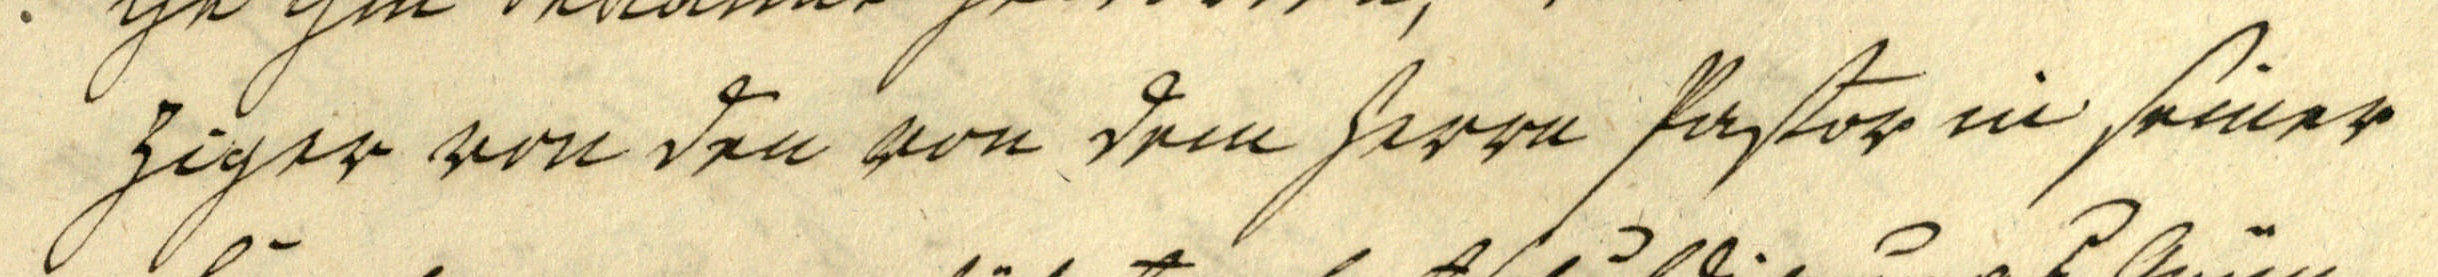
ziger von den von dem herrn Pastor in seiner
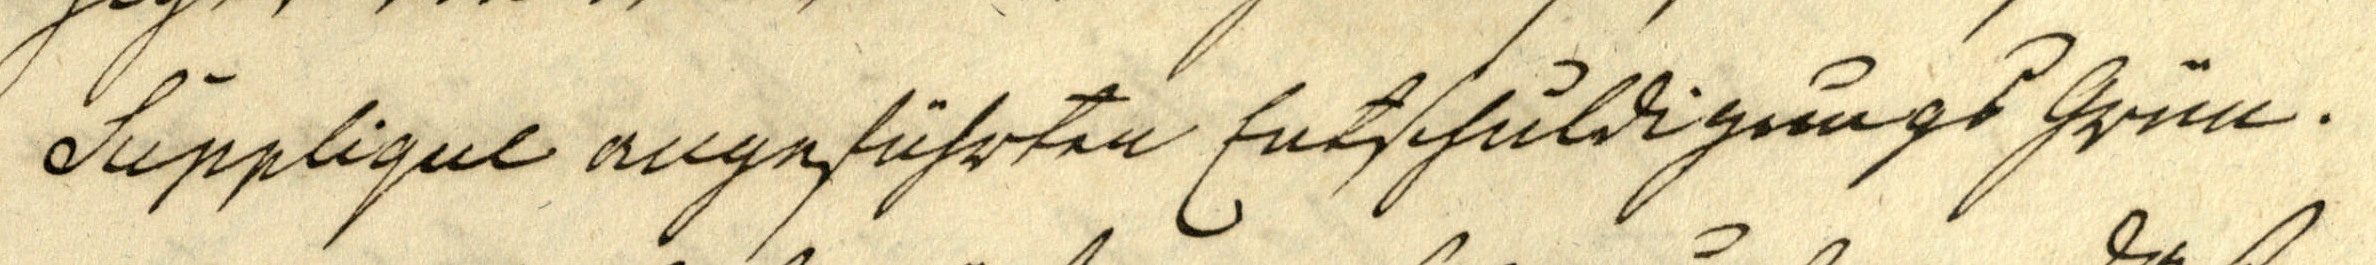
Supplique angeführten Entschuldigungs Grün-
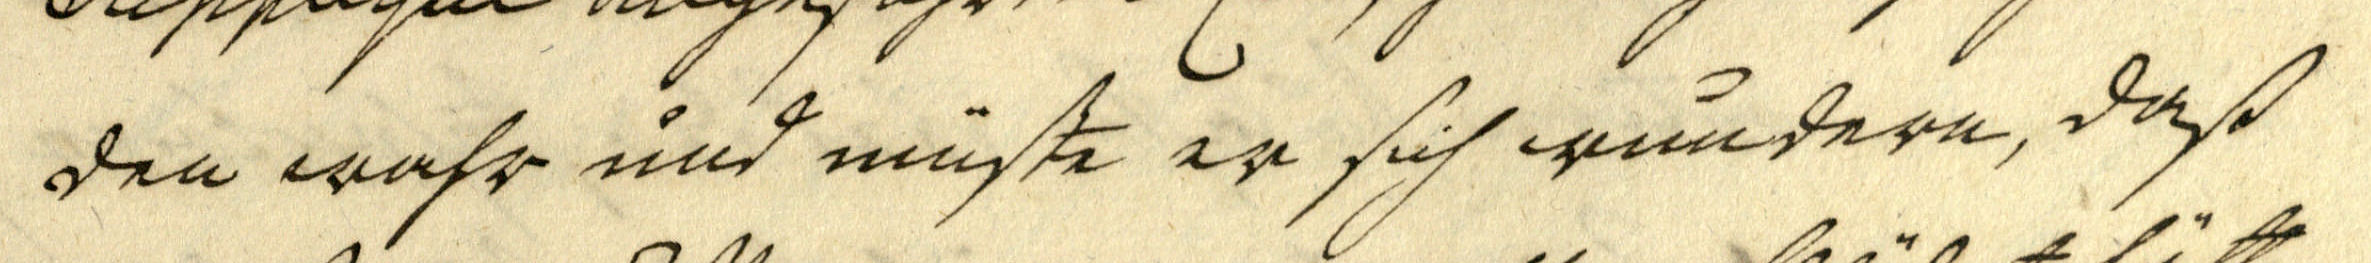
den wahr und müßte er sich wundern, daß
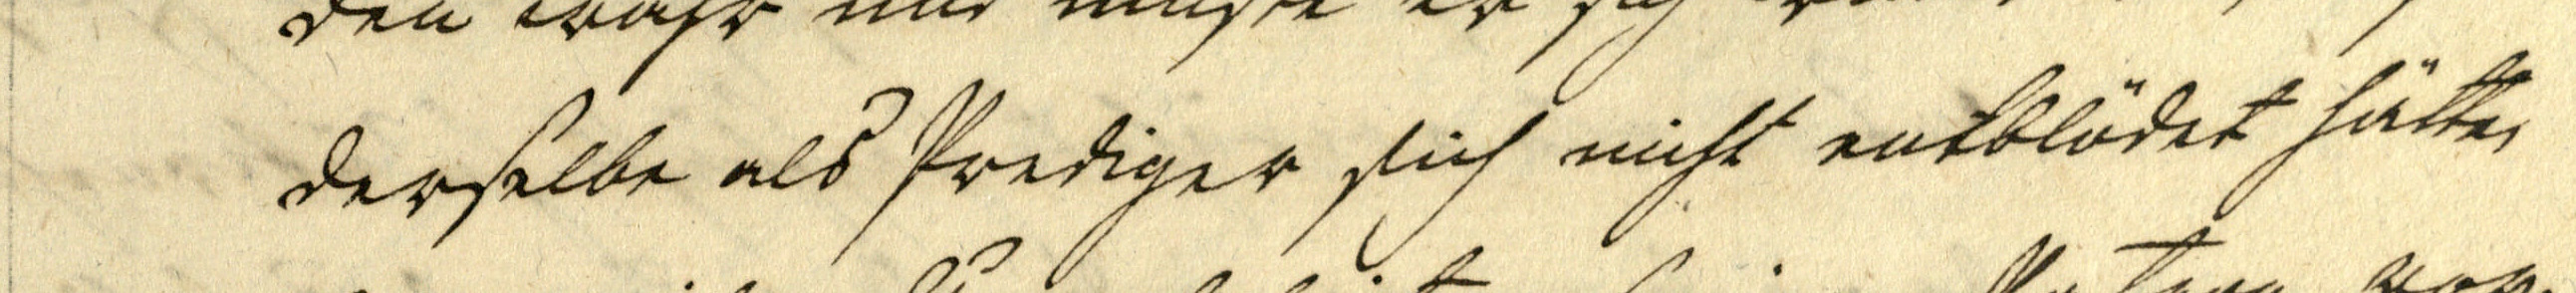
derselbe als Prediger sich nicht entblödet hätte,
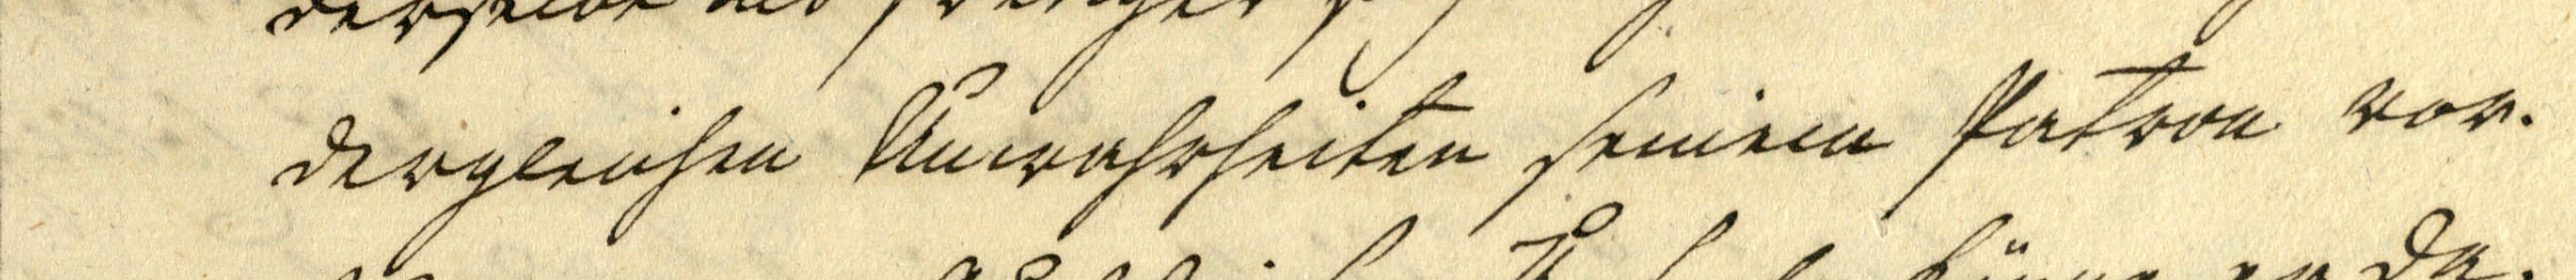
dergleichen Unwahrheiten seinem Patron vor-
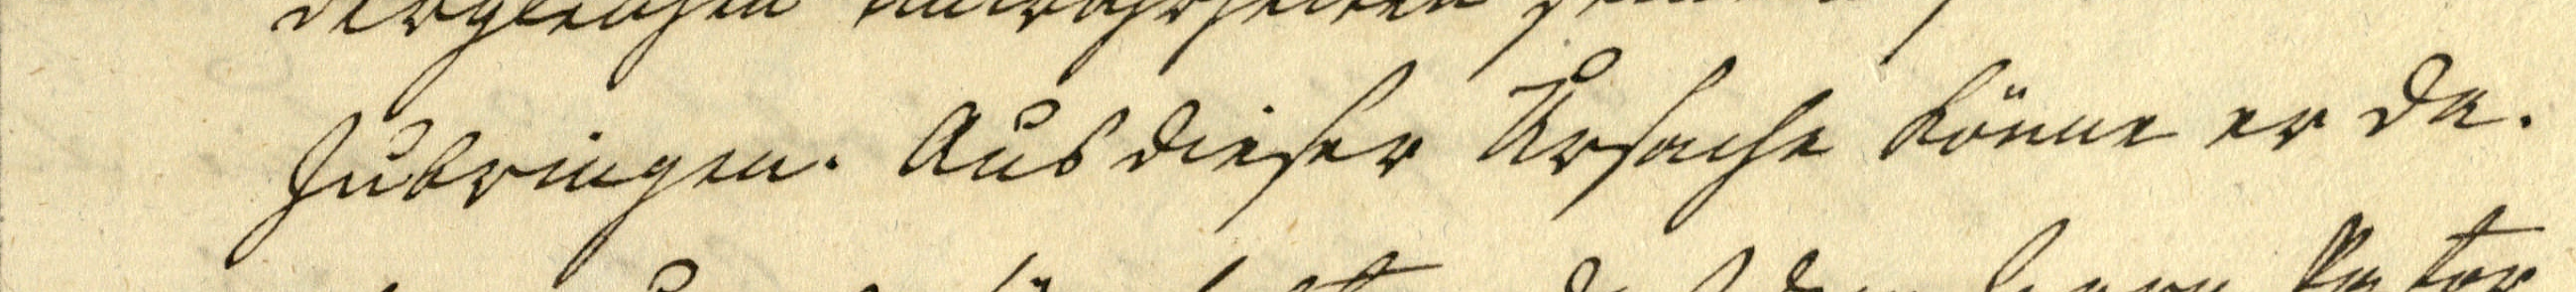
zubringen. Aus dieser Ursache könne er da-
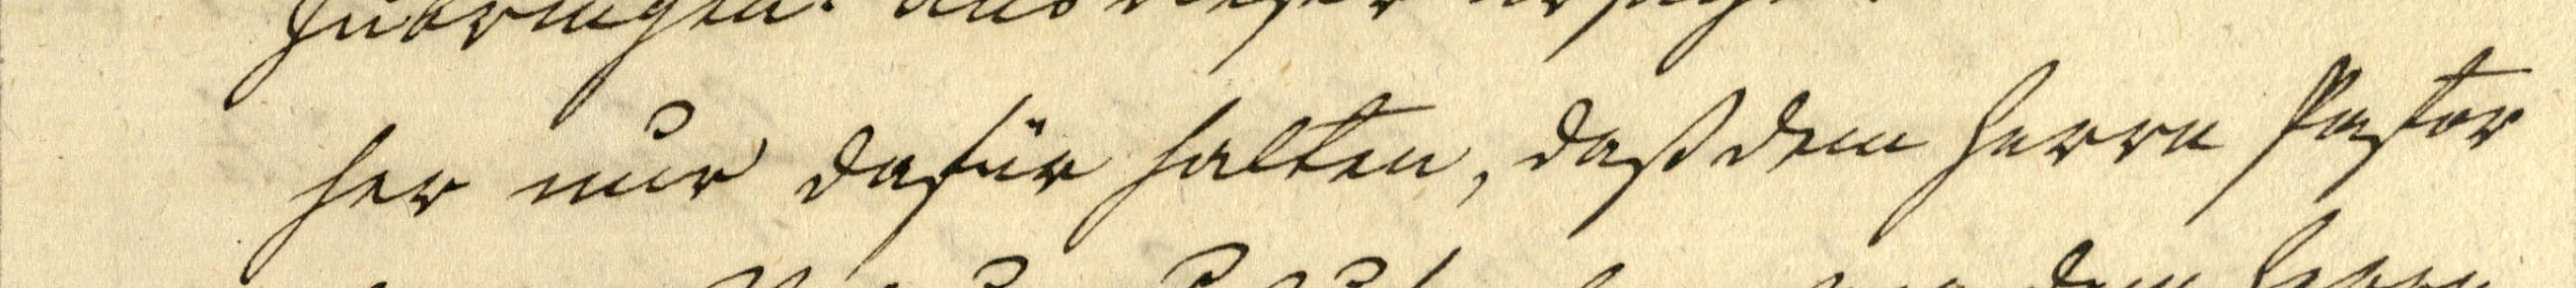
her nur dafür halten, daß dem herrn Pastor
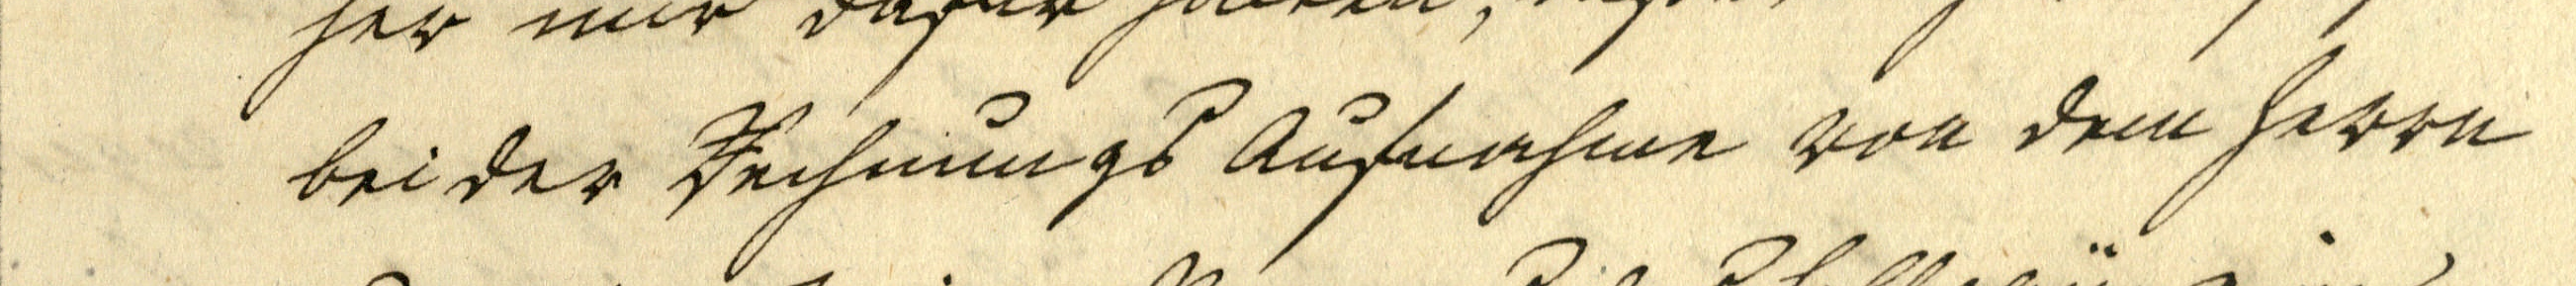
bei der Rechnungs Aufnahme von dem herrn
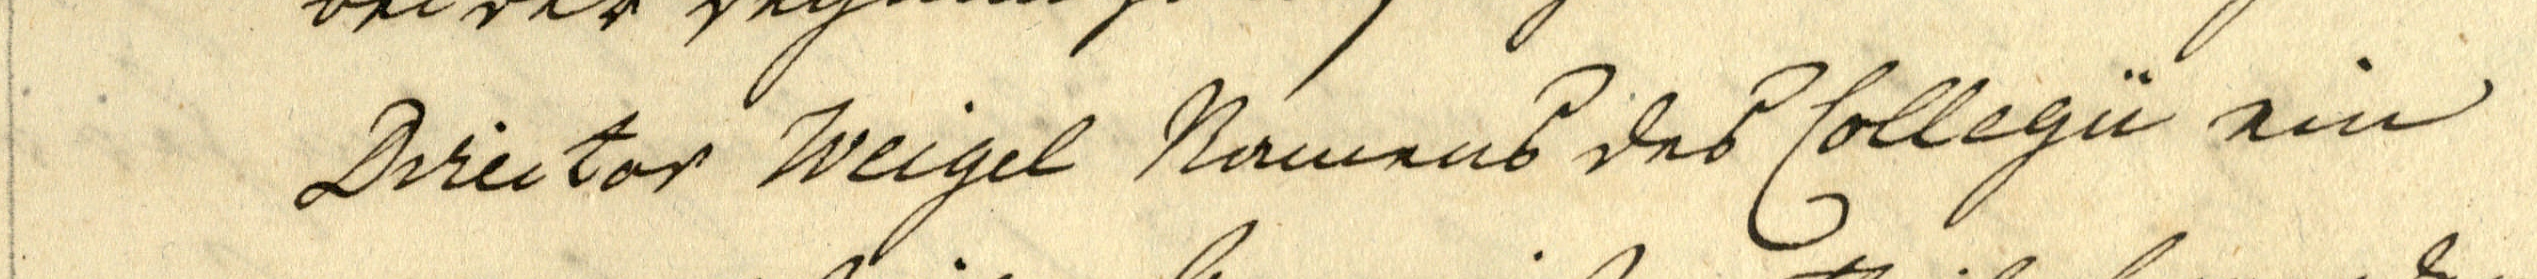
Director Weigel Namens des Collegii ein
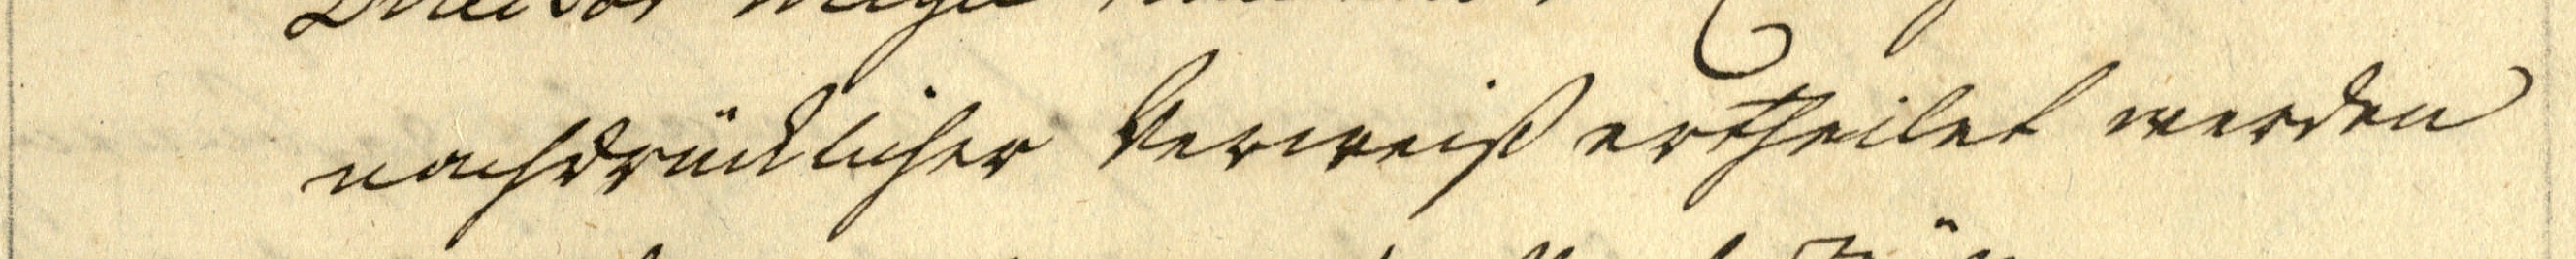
nachdrücklicher Verweis ertheilet werden
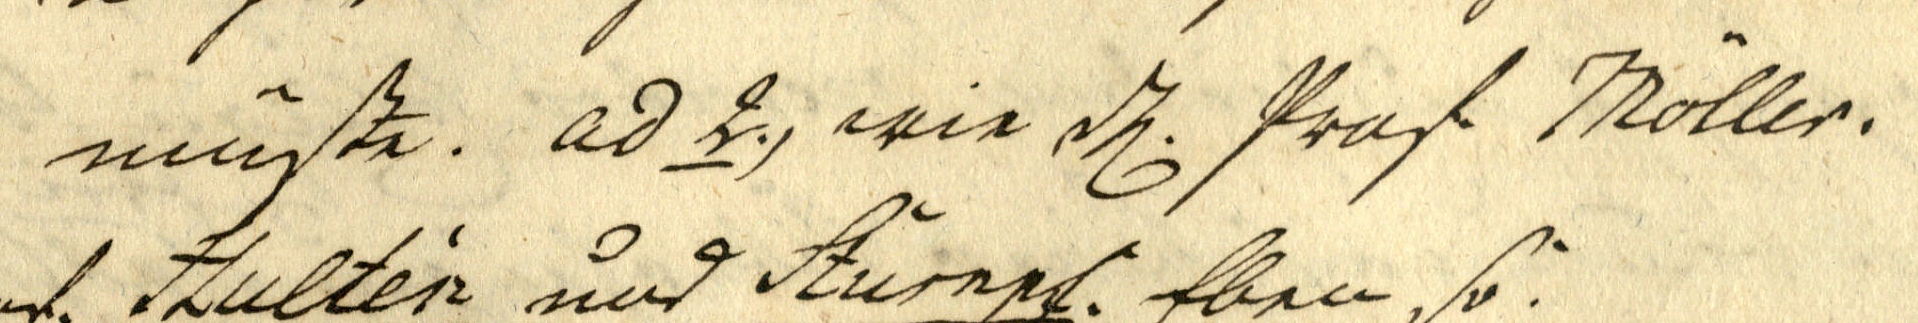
müßte. Ad 2., wie dh. Prof. Möller.
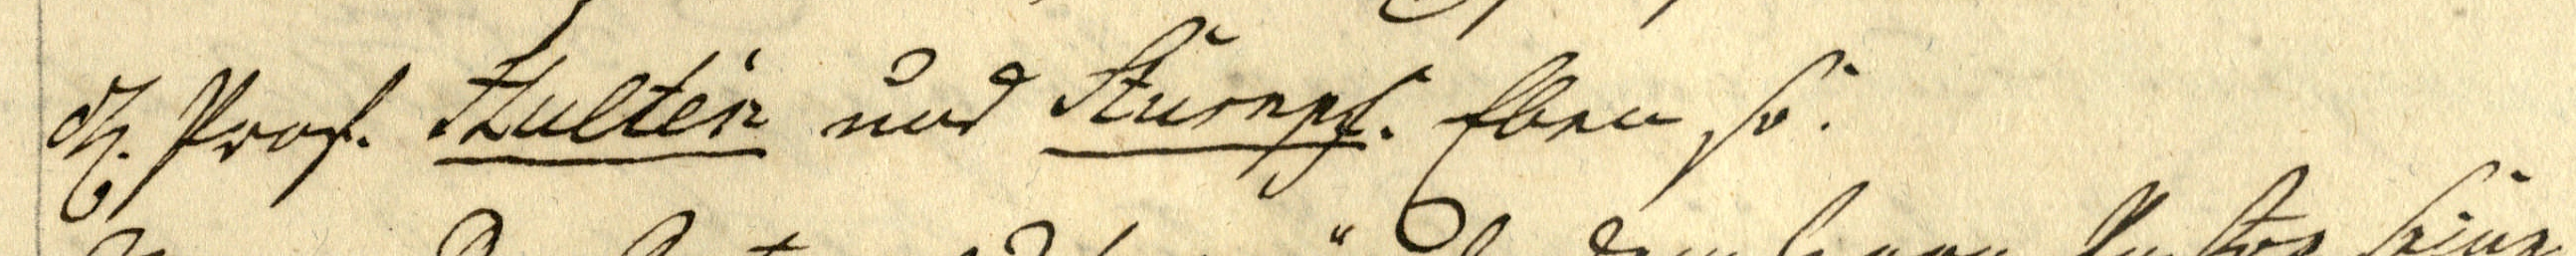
dh. Prof. Hultén und Stumpf. Eben so.
